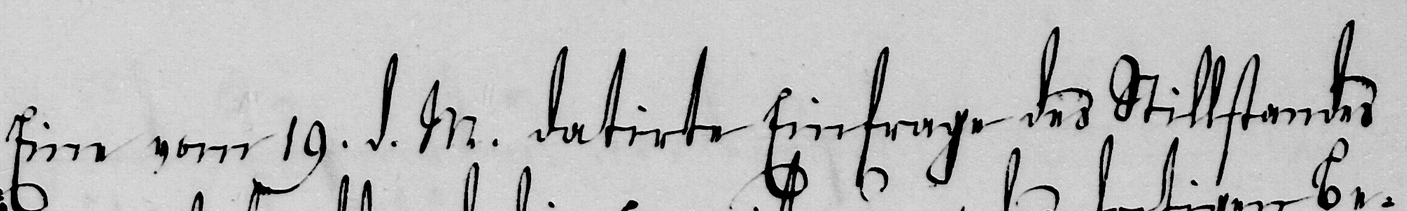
Eine vom 19. d. M. datirte Einfrage des Stillstandes
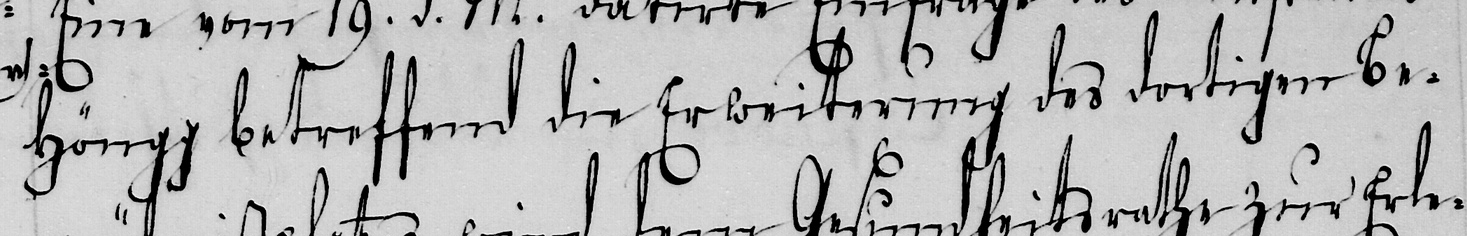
Höngg betreffend die Erweiterung des dortigen Be¬
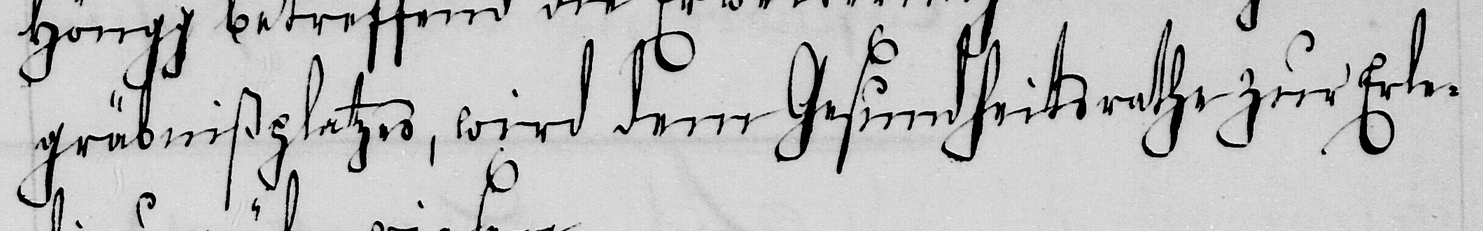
gräbnißplatzes, wird dem Gesundheitsrathe zur Erle¬
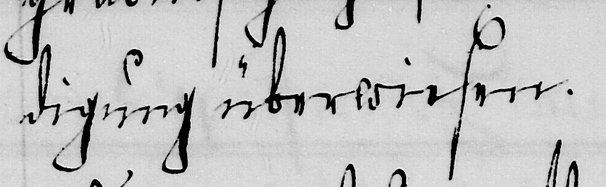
digung überwiesen.
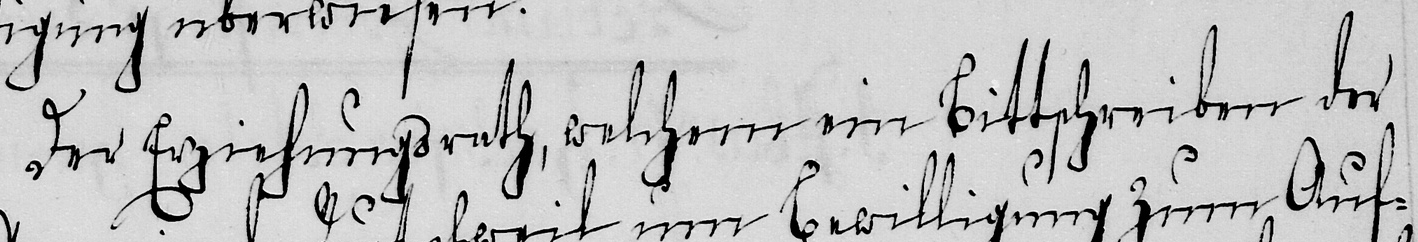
Der Erziehungsrath, welchem ein Bittschreiben der
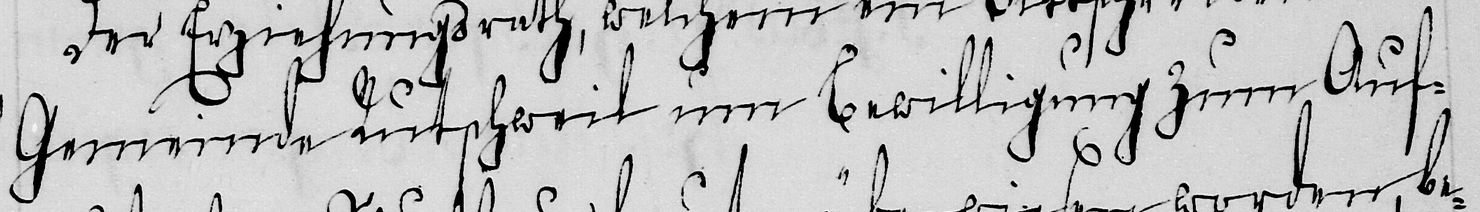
Gemeinde Rutschweil um Bewilligung zum Auf¬
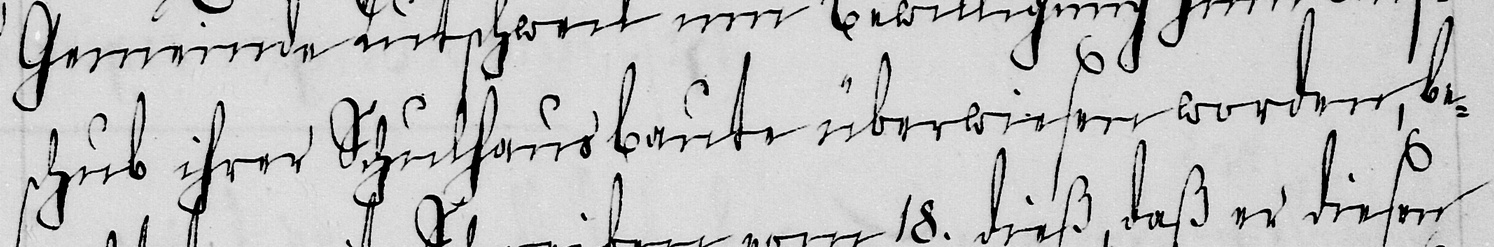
schub ihrer Schulhausbaute überwiesen worden, be¬
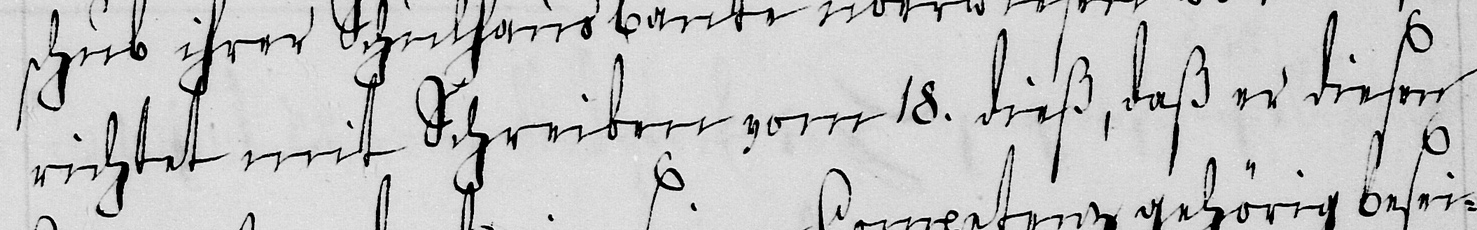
richtet mit Schreiben vom 18. dieß, daß er diesen
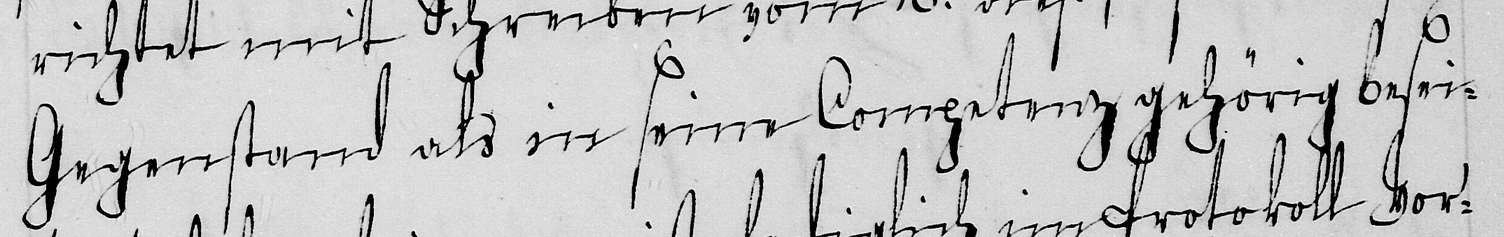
Gegenstand als in seine Competenz gehörig besei¬
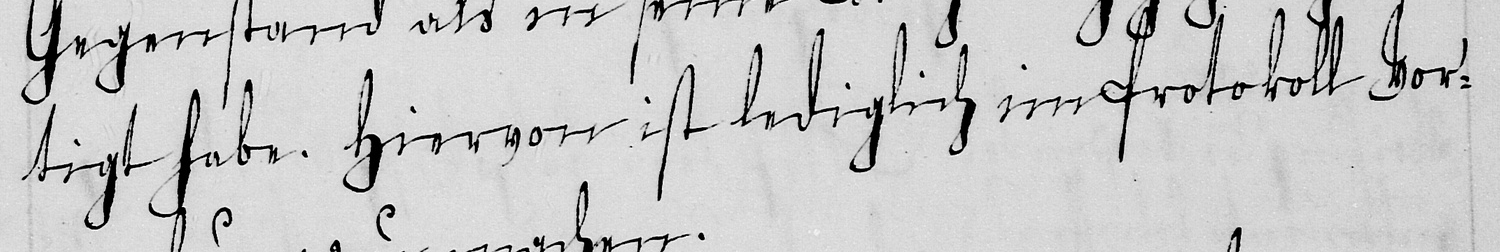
tigt habe. Hiervon ist lediglich im Protokoll Vor¬
